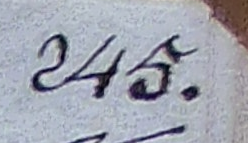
245.
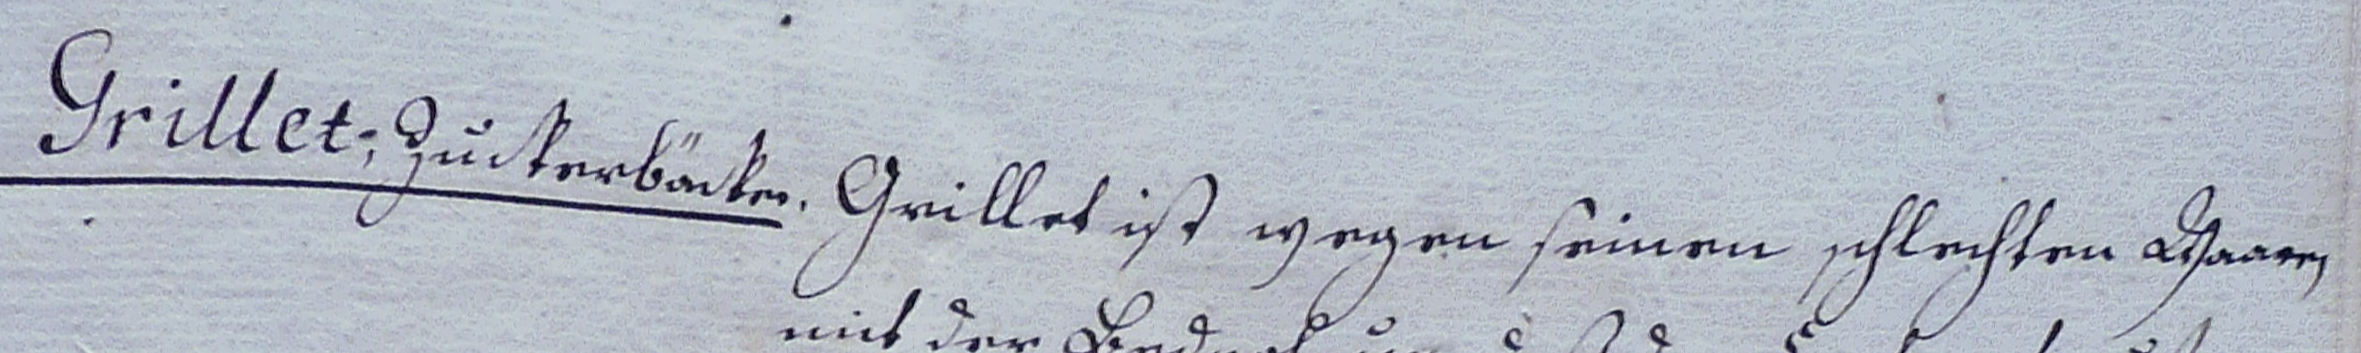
Grillet, Zuckerbäcker. Grillet ist wegen seinen schlechten Waaren
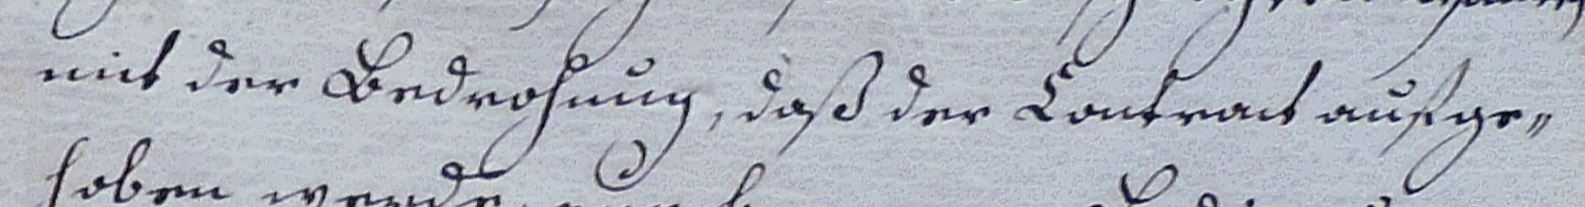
mit der Bedrohung, daß der Contract aufge¬
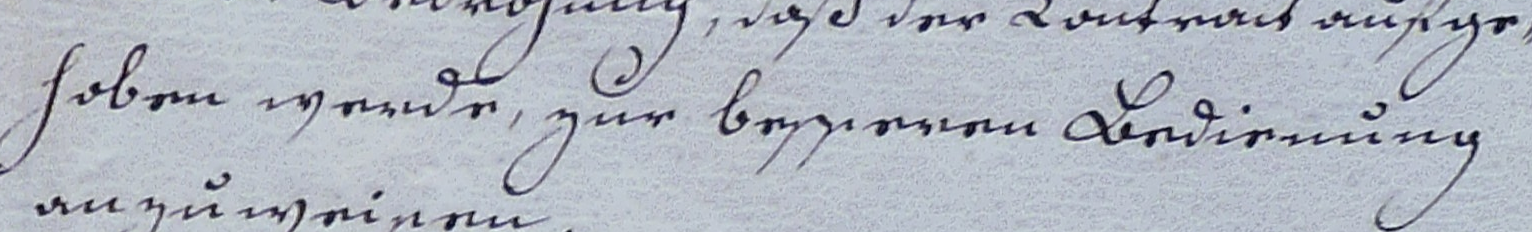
hoben werde, zur besseren Bedienung
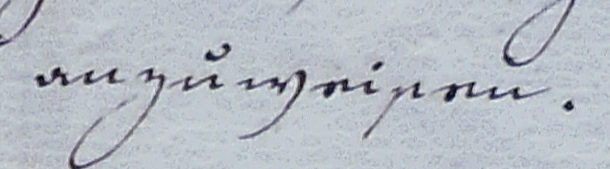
anzuweisen.
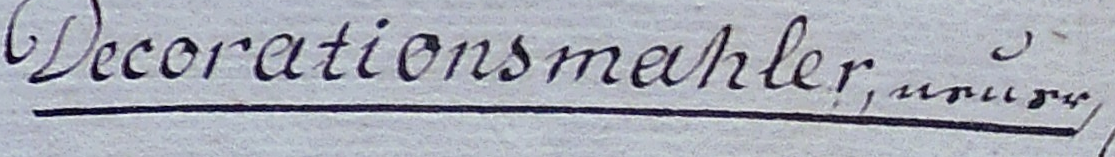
Decorationsmahler, neuer,
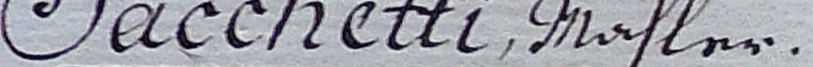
Sachetti, Mahler.
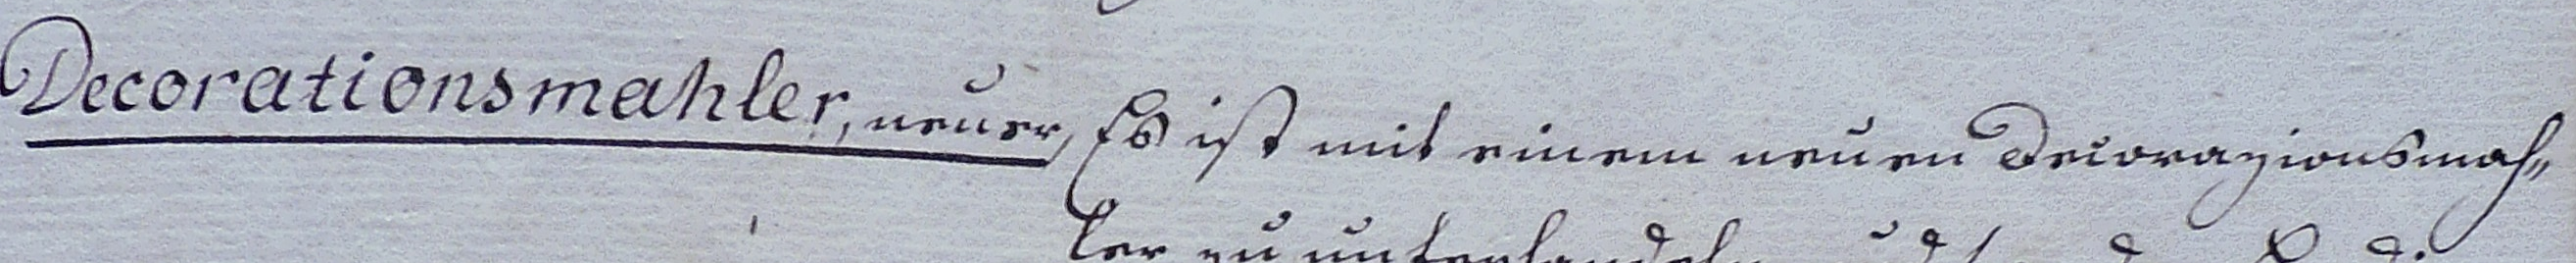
Es ist mit einem neuen Decorazionsmah¬
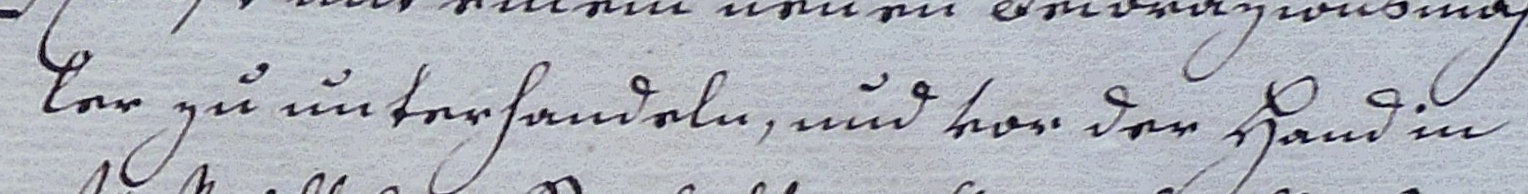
ler zu unterhandeln, und vor der Hand in
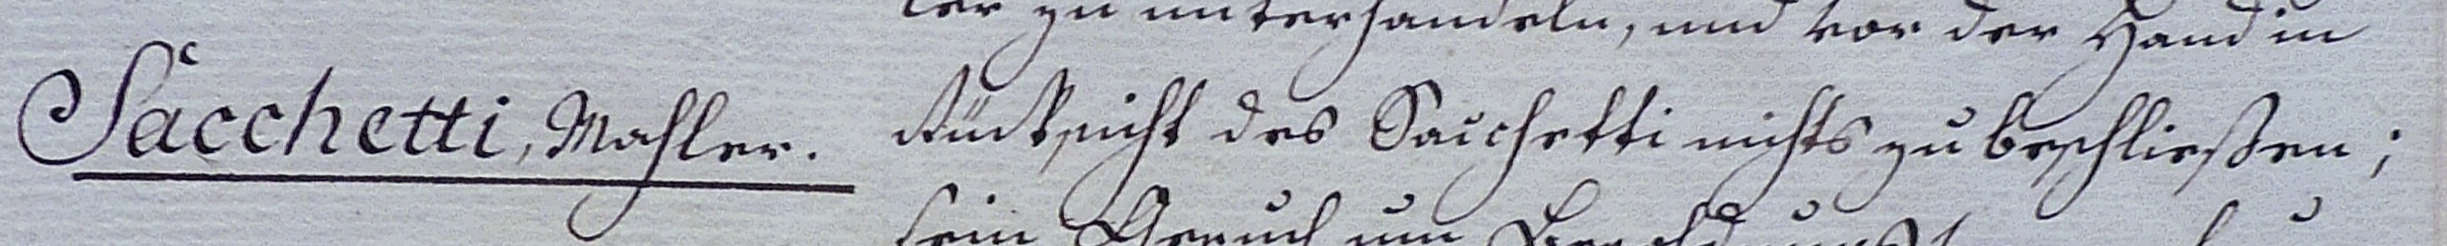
Rücksicht des Sachetti nichts zubeschließen;
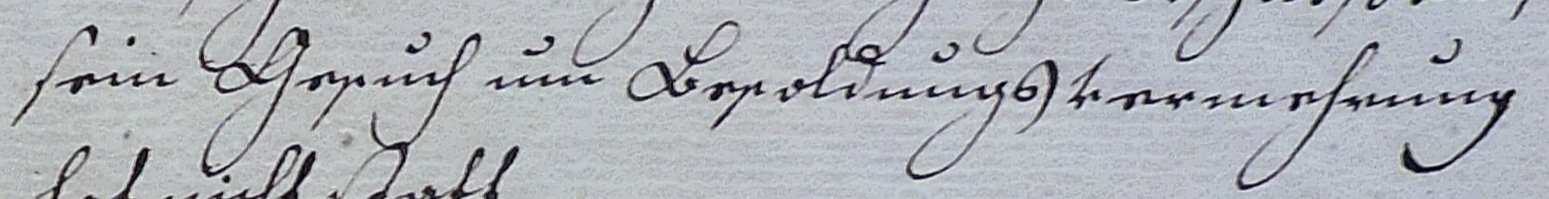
sein Gesuch um Besoldungsvermehrung
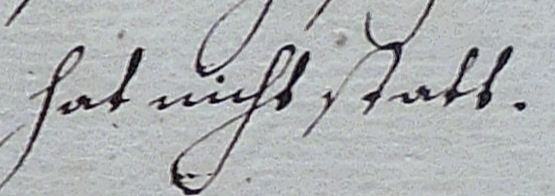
hat nicht statt.
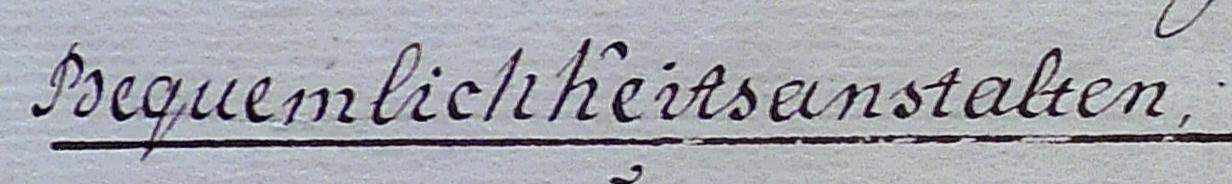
Bequemlichkeitsanstalten,
